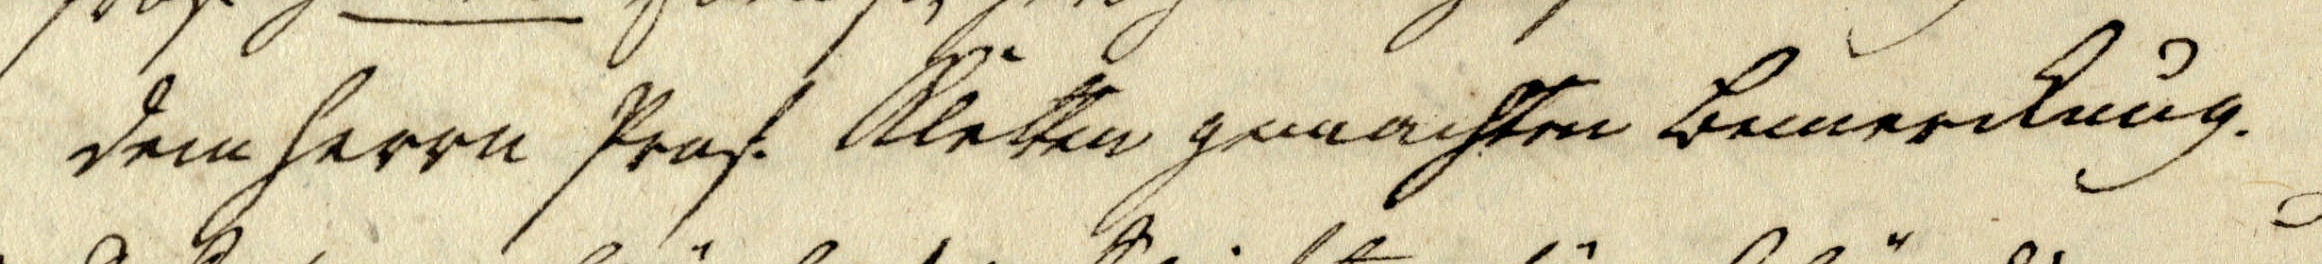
dem Herrn Prof. Kletten gemachten Bemerckung.
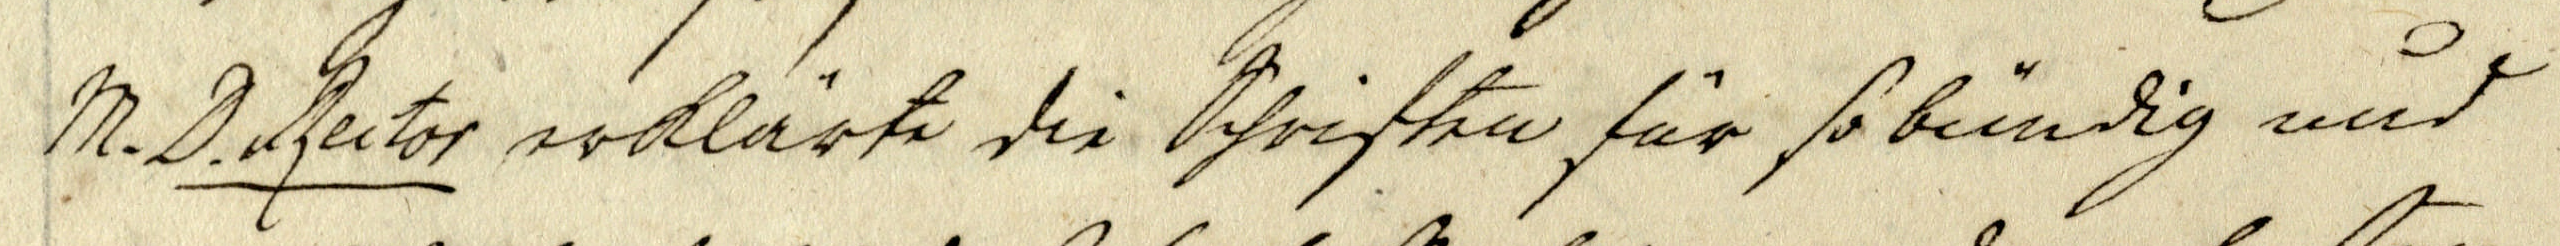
M. D Rector erklärte die Schriften für so bündig und
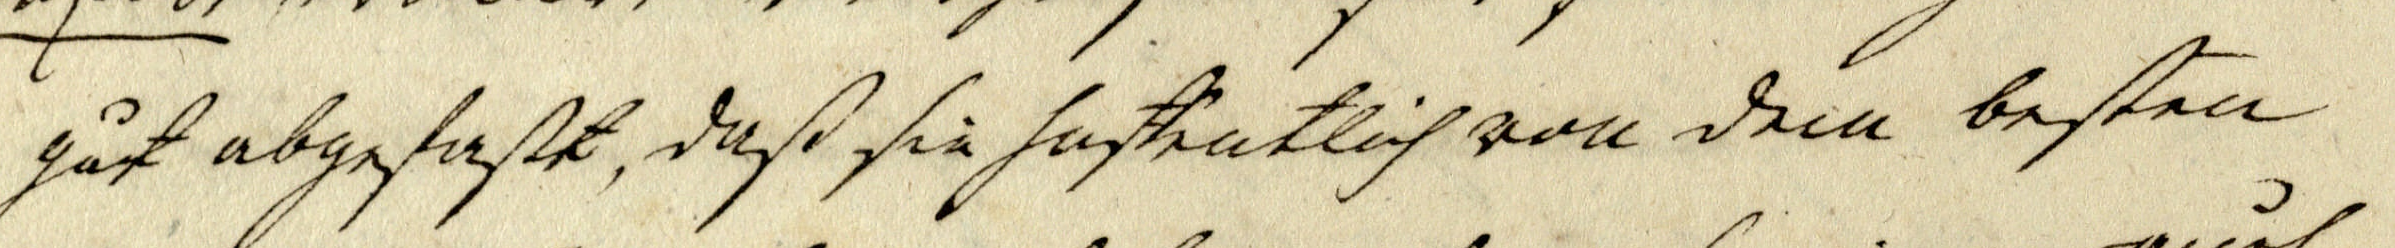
gut abgefaßt, daß sie hoffentlich von dem besten
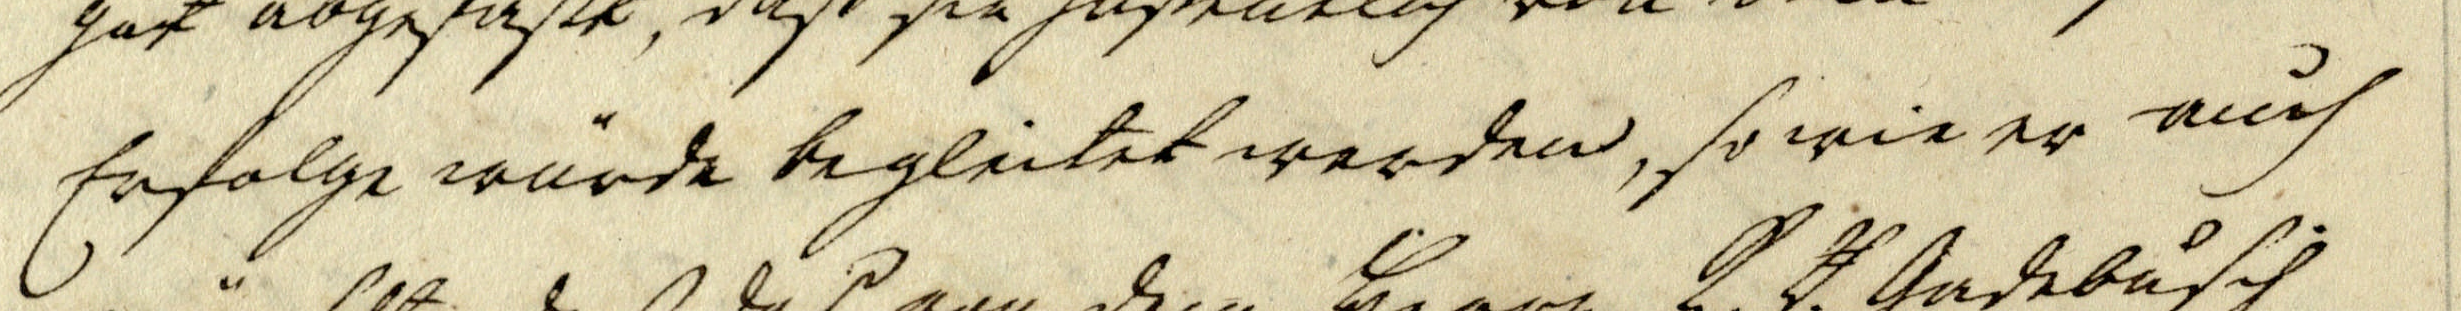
Erfolge würde begleitet werden, so wie er auch
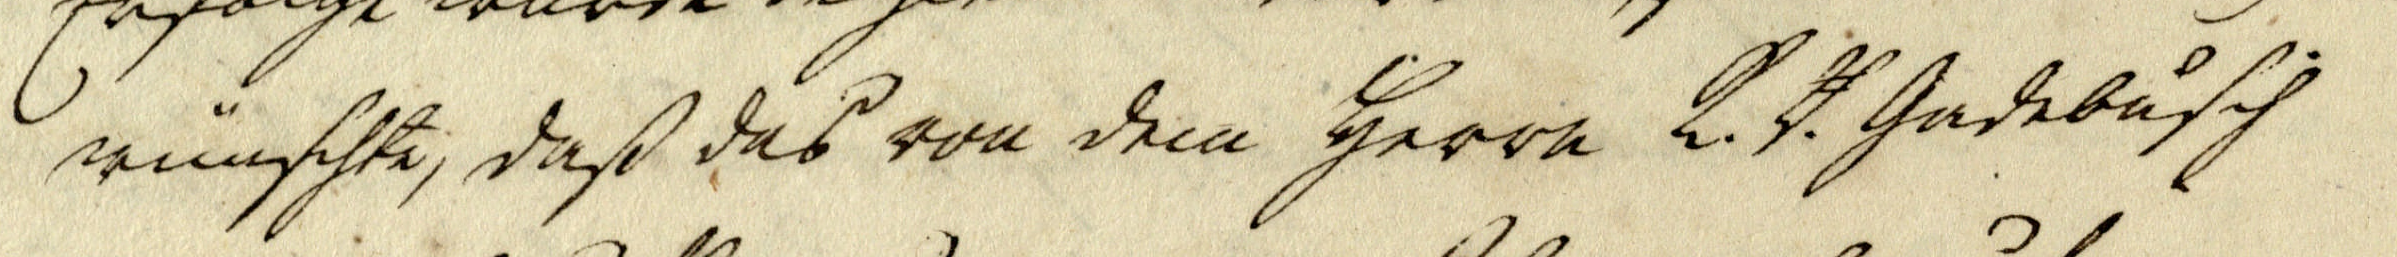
wünschte, daß das von dem Herrn K. R. Gadebusch
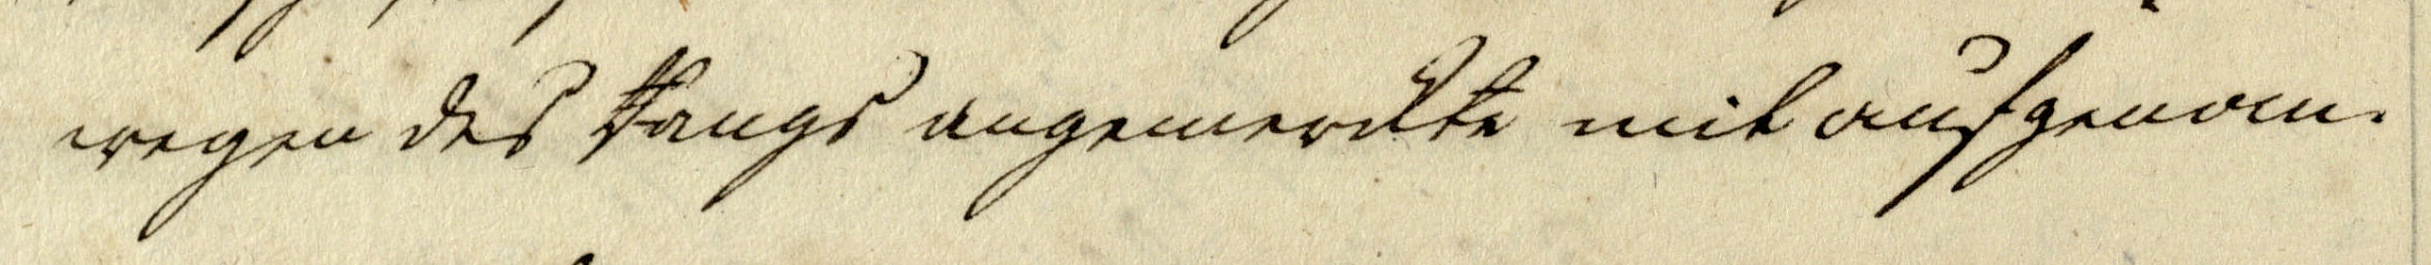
wegen des Rangs angemerckte mit aufgenom¬
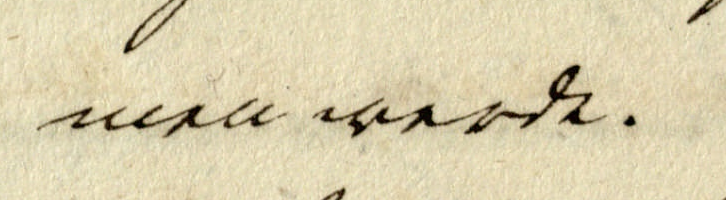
men werde.
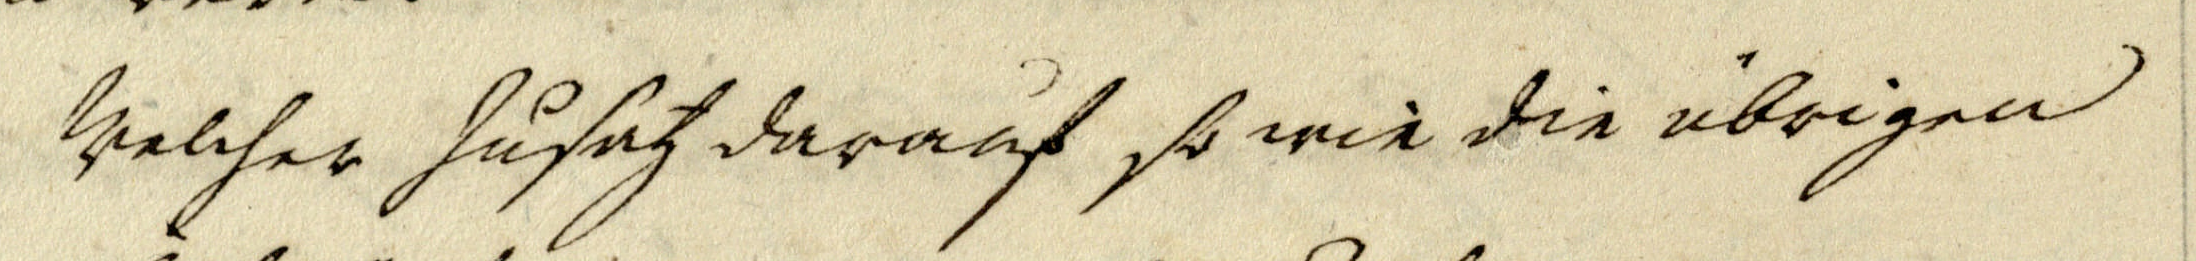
Welcher Zusatz darauf so wie die übrigen
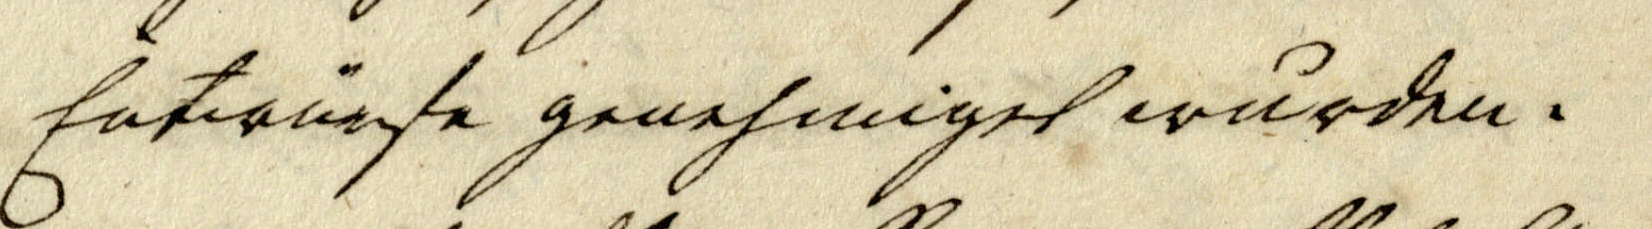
Entwürfe genehmiget wurden.
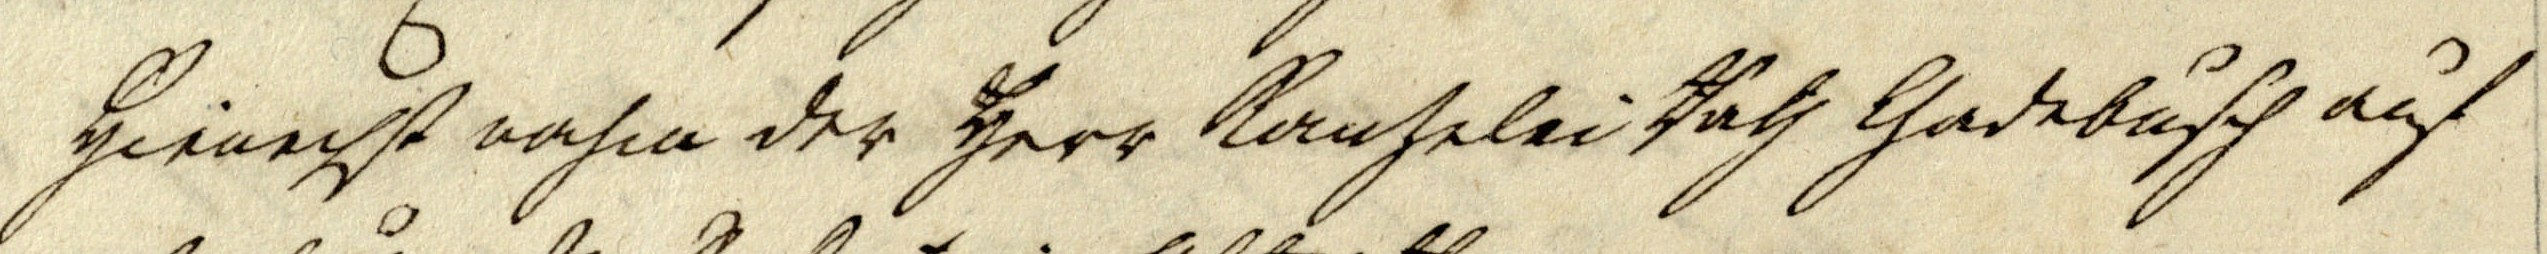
Hienechst nahm der Herr Kanzelei Rath Gadebusch auf
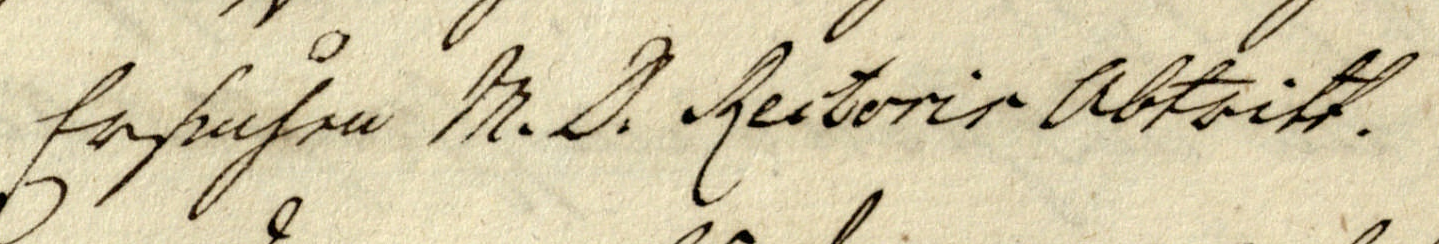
Ersuchen M. D. Rectoris Abtritt.
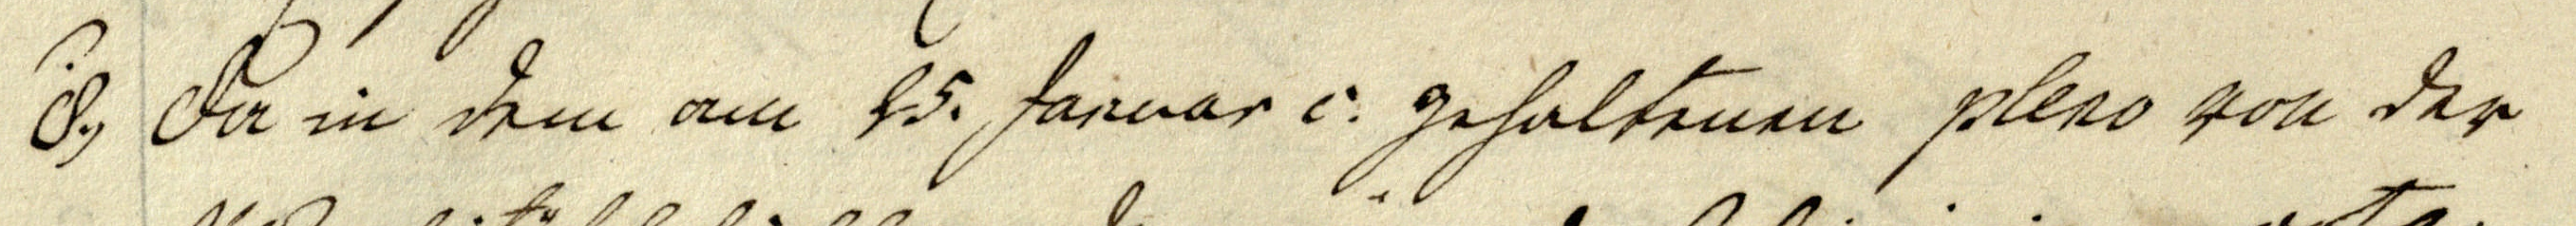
8., Da in dem am 25. Januar c. gehaltenen pleno von der
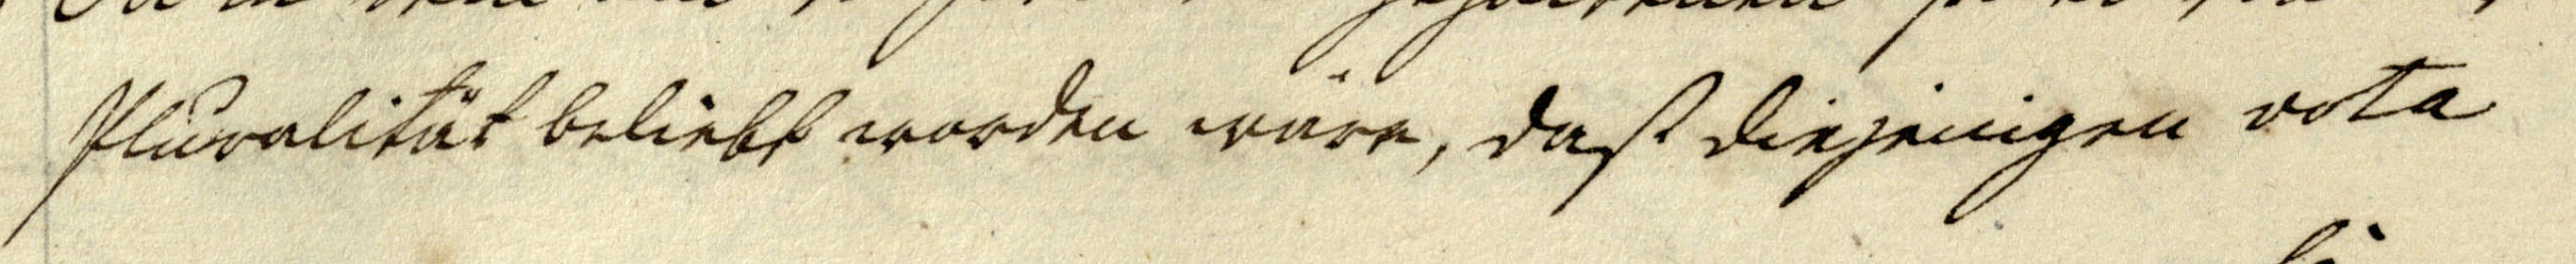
Pluralität beliebt worden wäre, daß diejenigen vota
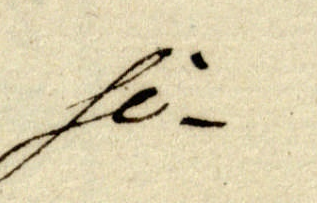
se¬
